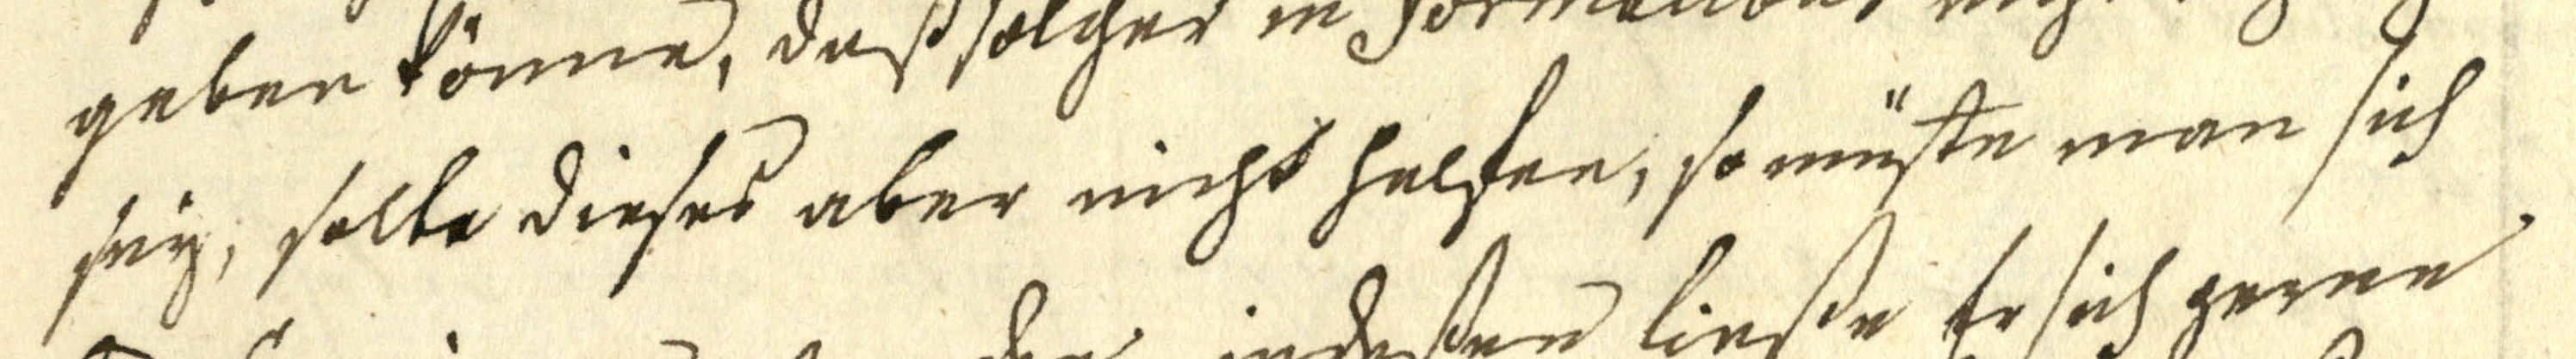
seÿ, solte dieses aber nicht helfen, so müste man sich
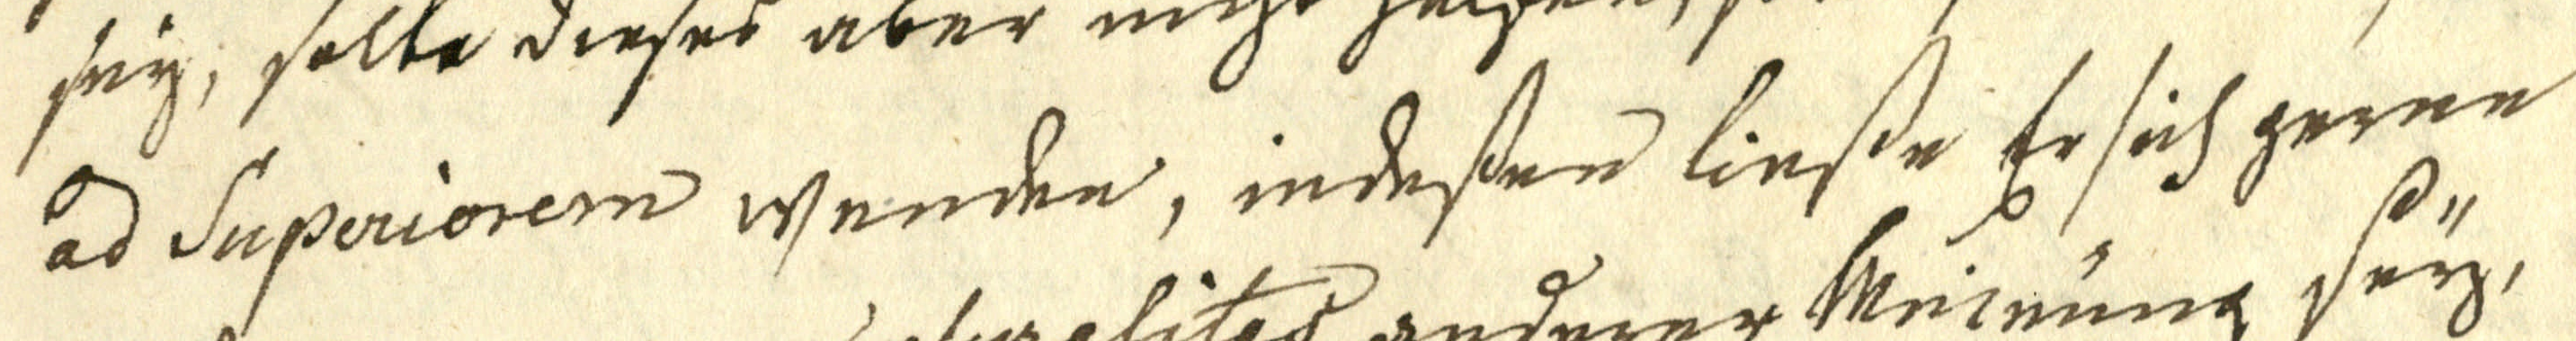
ad Superiorem wenden, indeßen ließe Er sich gerne
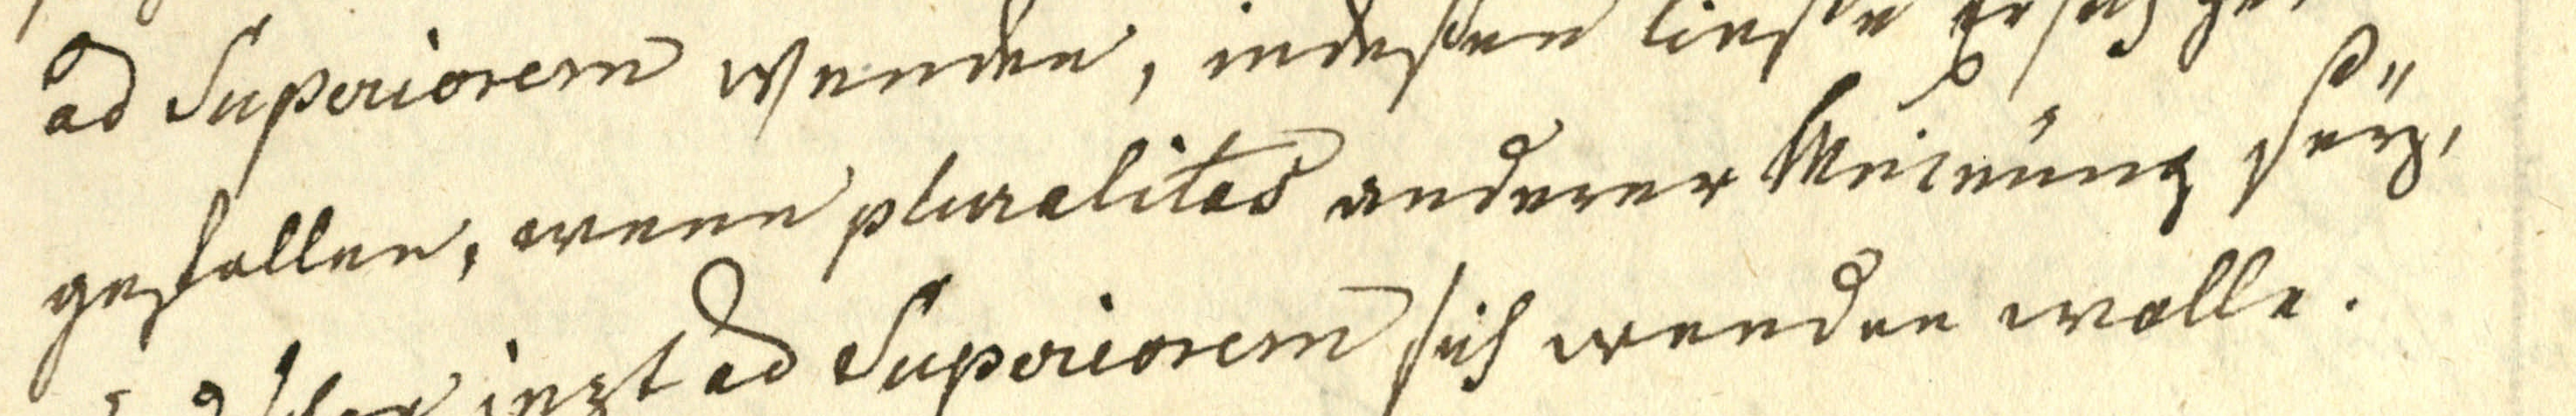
gefallen, wenn pluralitas anderer Meinung seÿ,
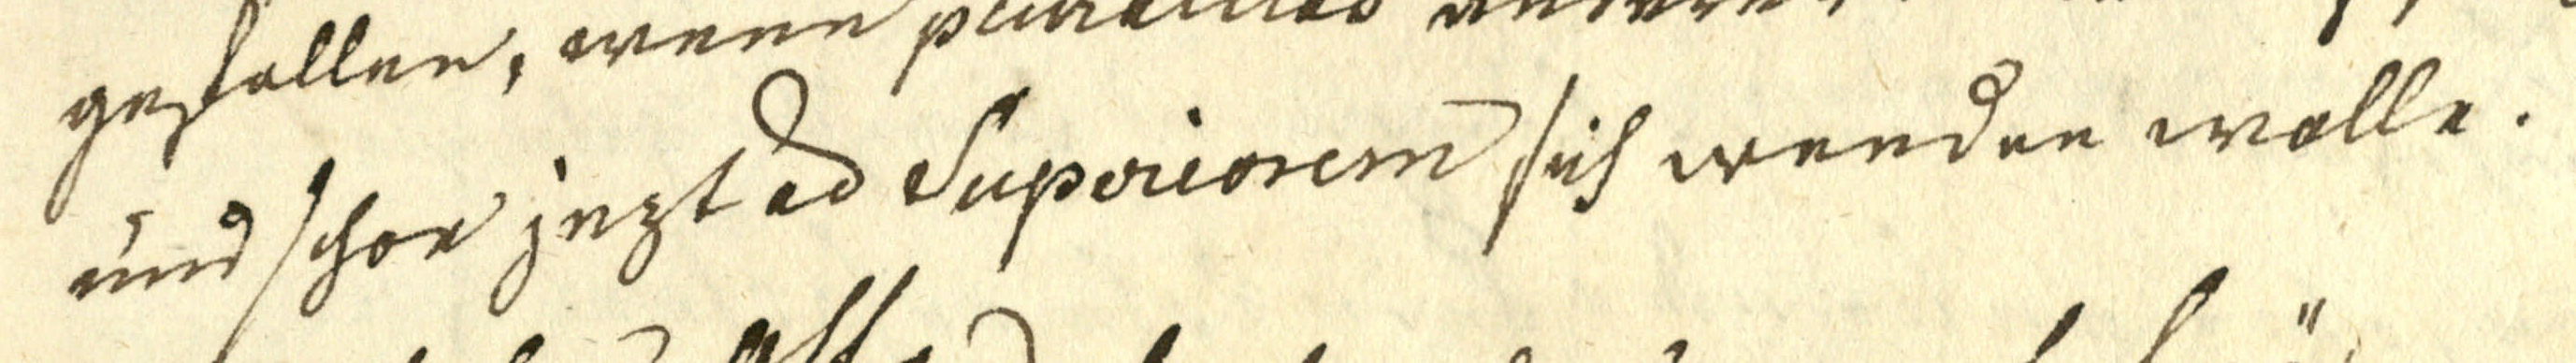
und schon jezt ad Superiorem sich wenden wolle.
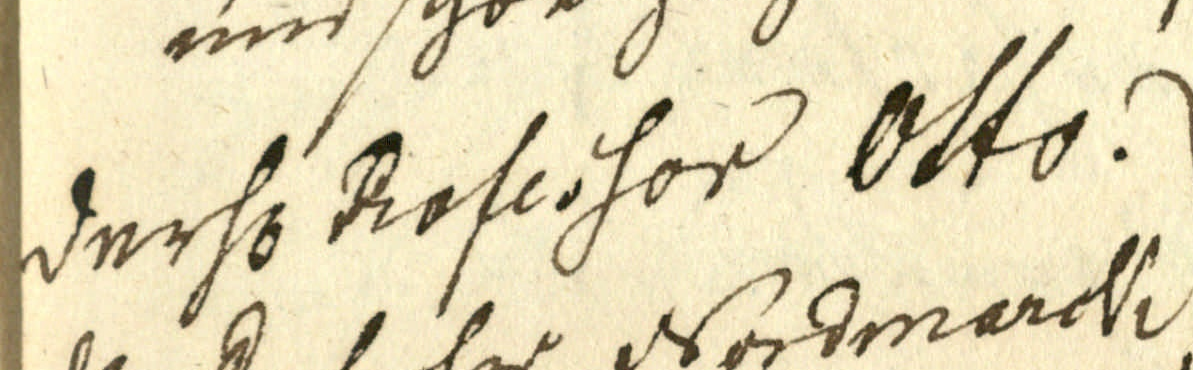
der h Professor Otto.
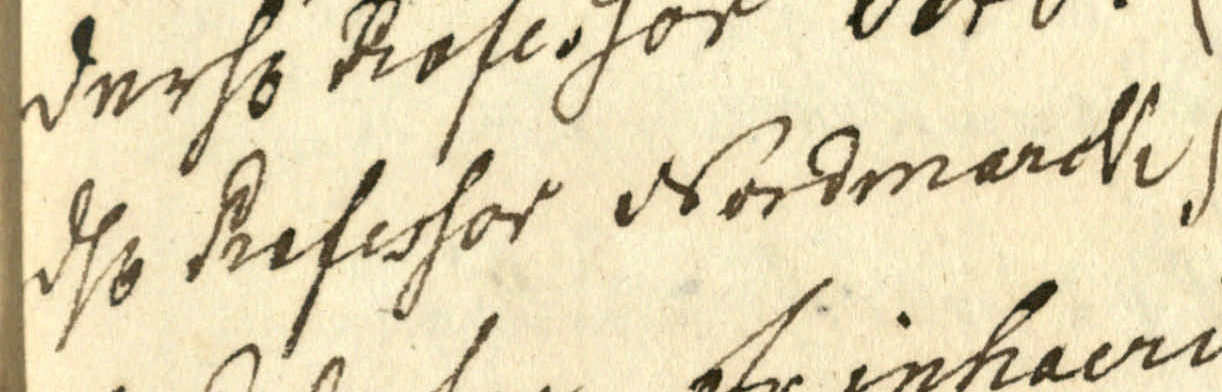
dh Professor Nordmarck
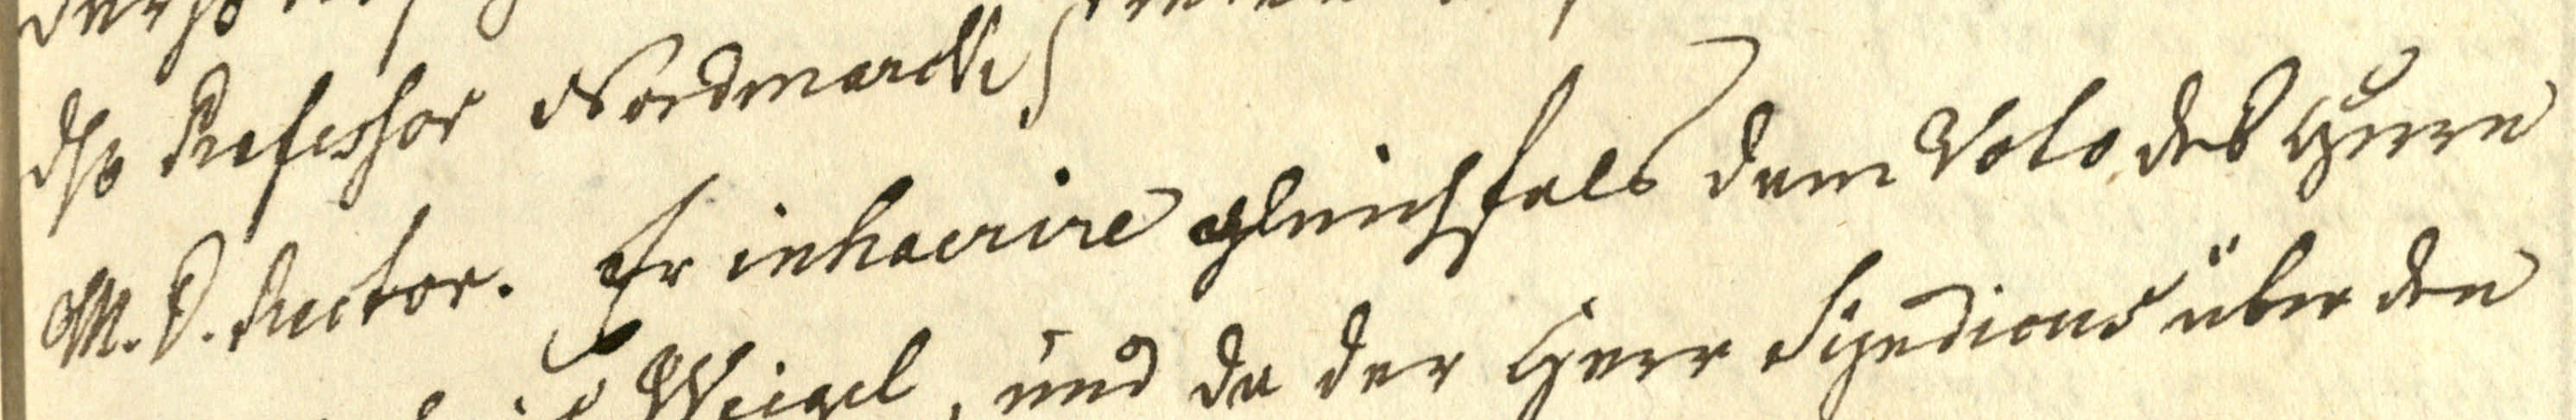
M D. Rector. Er inhaerire gleichfals dem Voto des Herrn
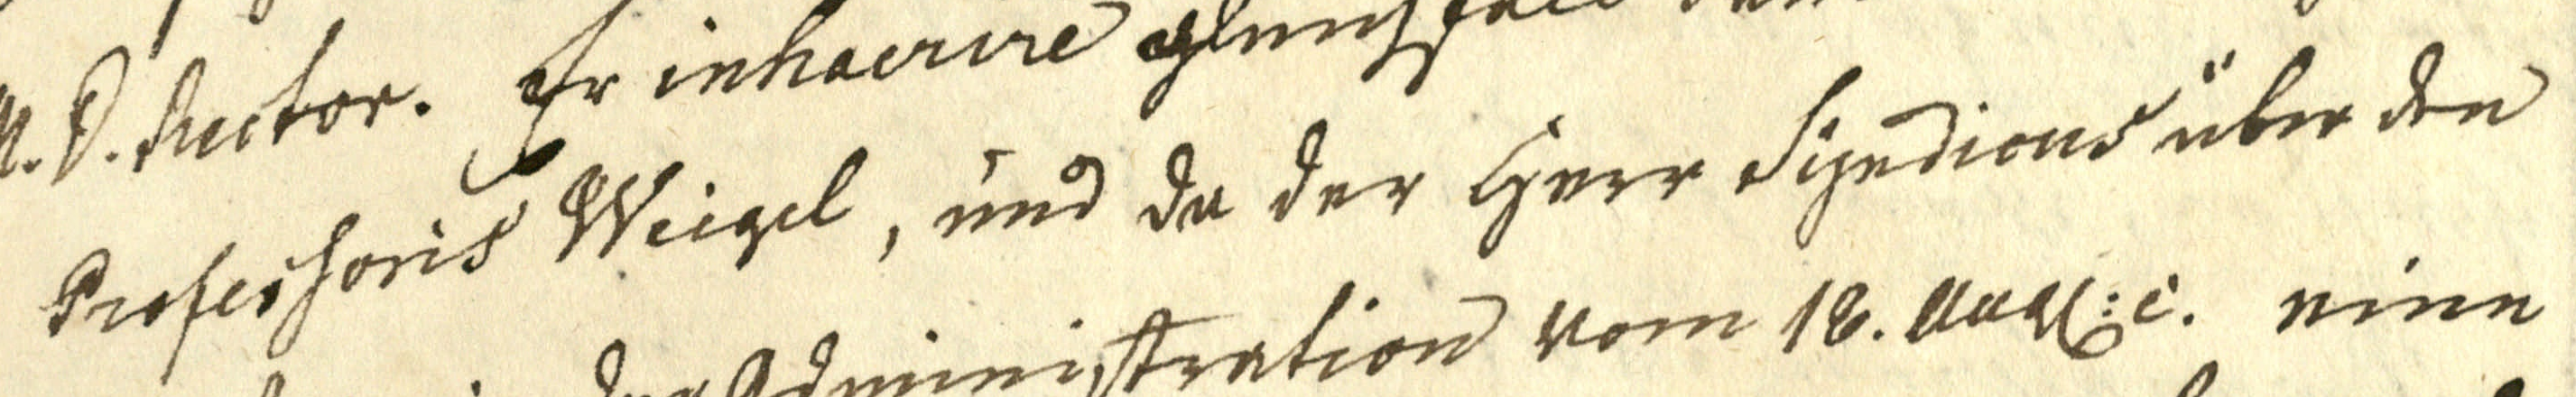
Professoris Weigel, und da der Herr Sÿndicus aber den
